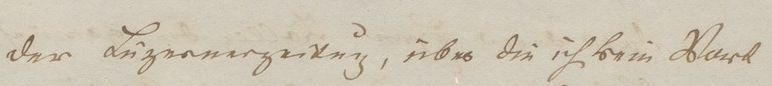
der Luzernerzeitung, über die ich kein Wort
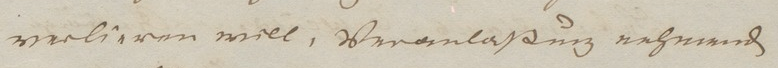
verlieren will, Veranlaßung nehmend
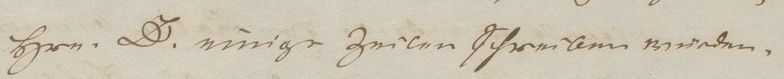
Hrn. D. einige Zeilen schreiben würden.
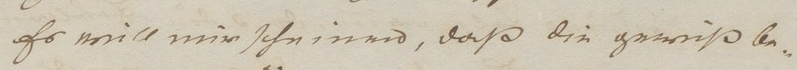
Es will mir scheinen, daß die gewiß be-
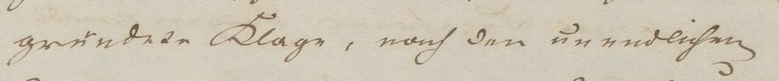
gründete Klage, nach den unendlichen
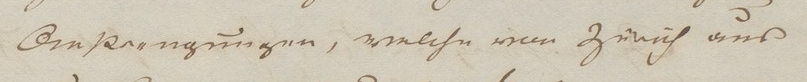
Anstrengungen, welche von Zürich aus
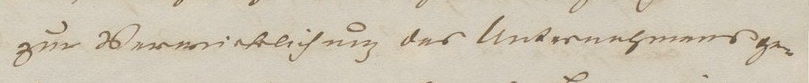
zu Verwirklichung des Unternehmens ge-
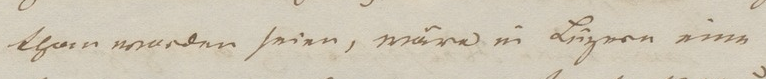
than worden seien, wäre in Luzern eine
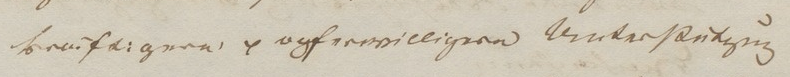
kräftigere & opferwilligere Unterstützung
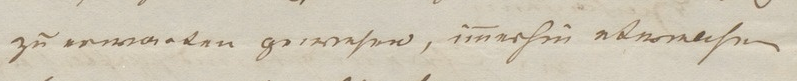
zu erwarten gewesen, immerhin etwelchen
